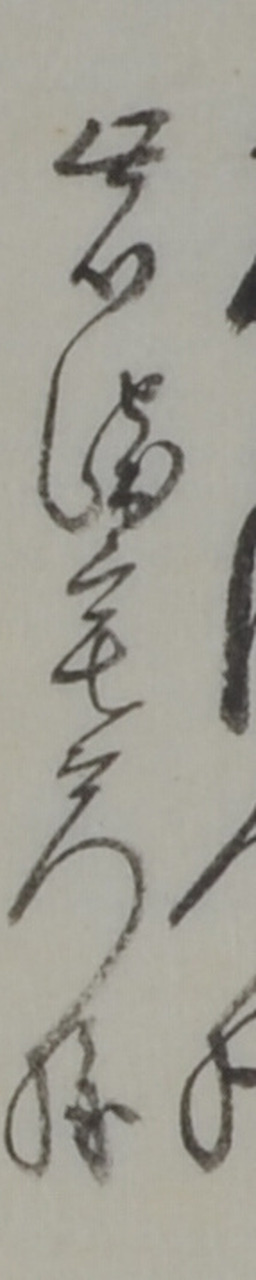岩崎宅右衛門様
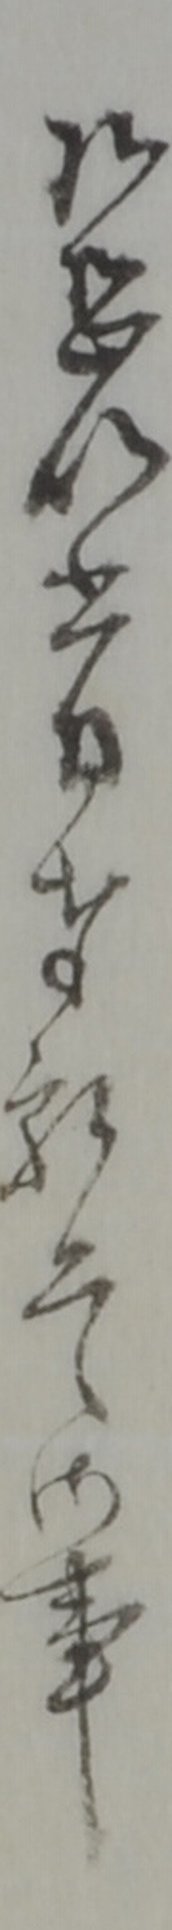乍恐以書付奉願上候御事
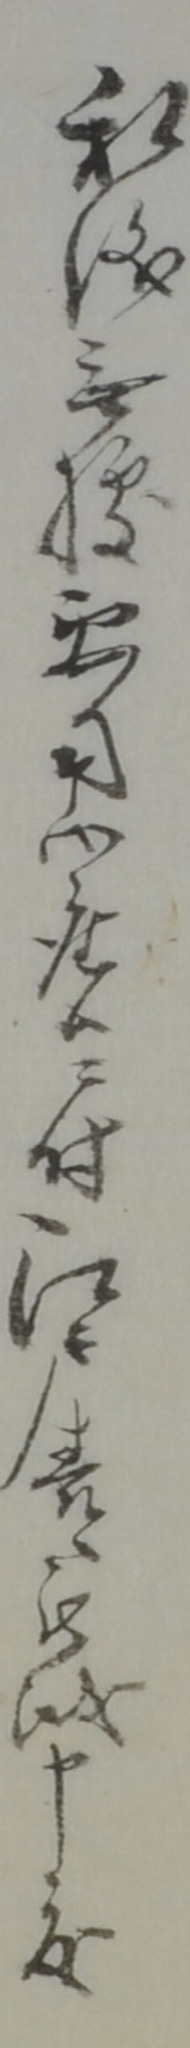私儀無拠要用御座候ニ付江戸表へ罷越申度
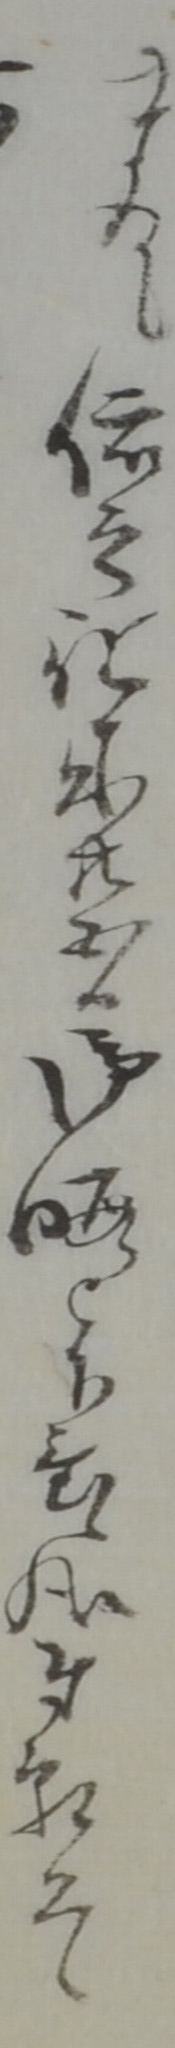奉存候依之従来廿五日御暇被下置候様奉願上候
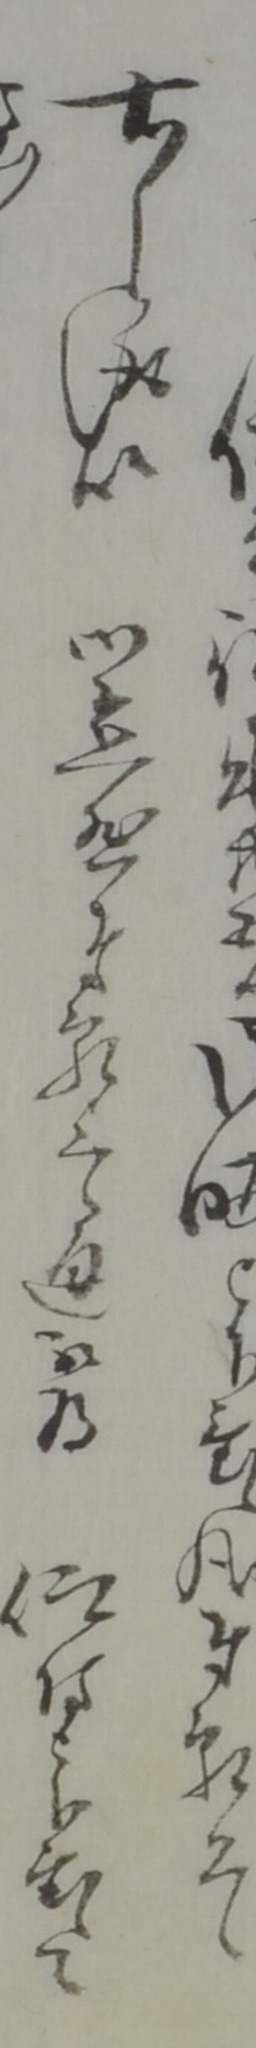右之趣以御慈悲奉願上候通被為仰付被下置候ハゝ
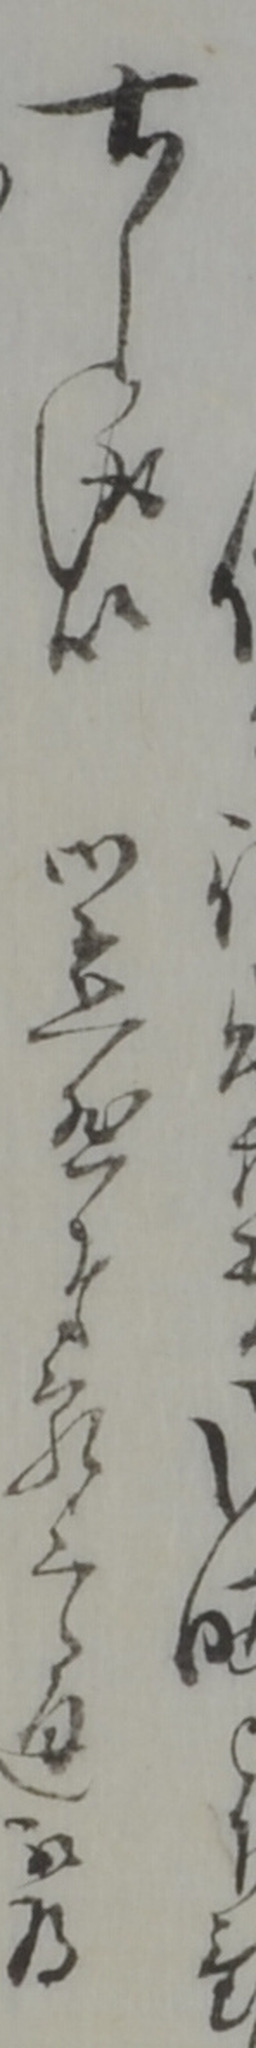右之趣以御慈悲奉願上候通被為仰付
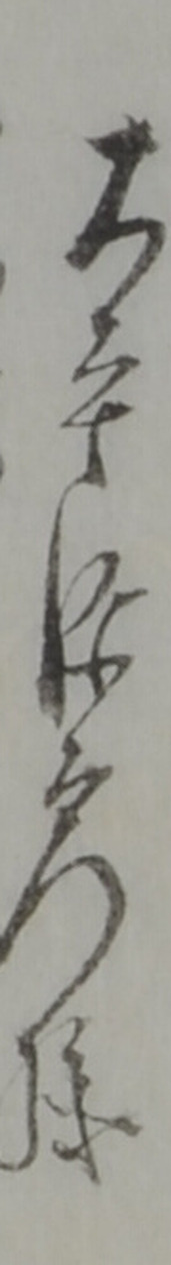大平源右衛門様
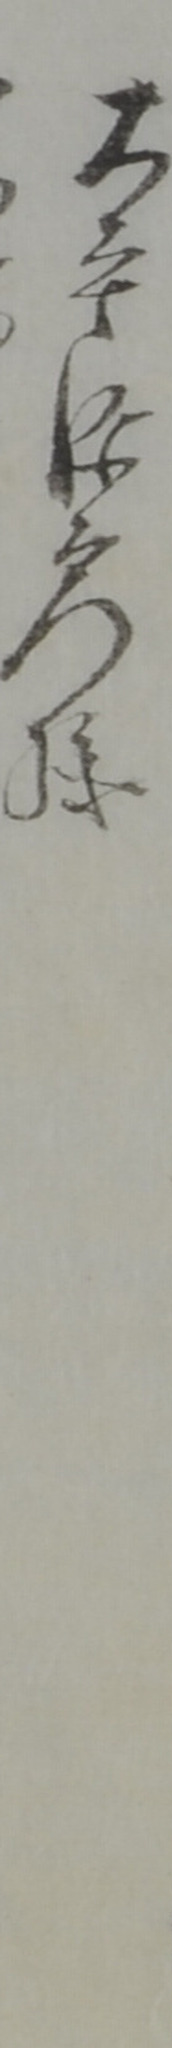大平源右衛門様
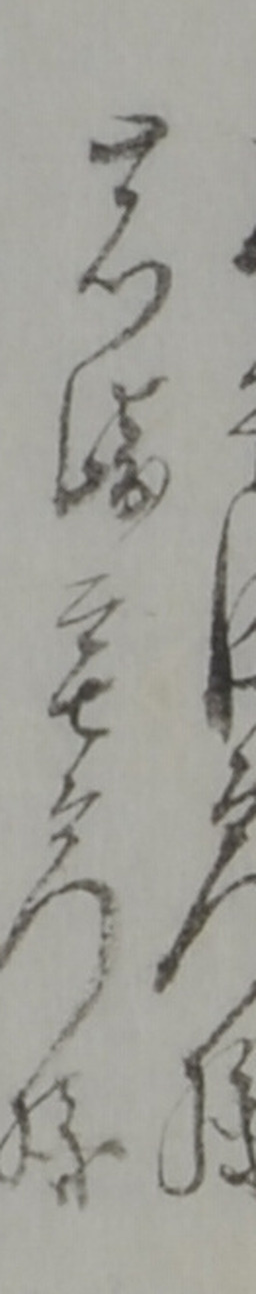岩崎宅右衛門様
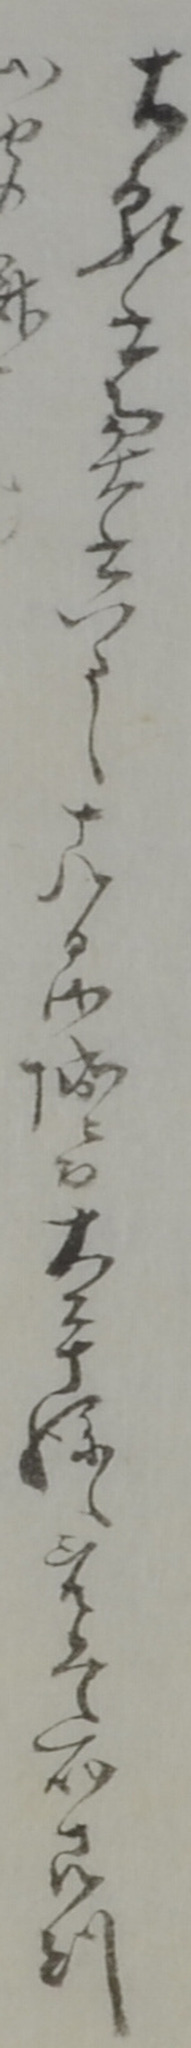右願書奥書いたし十八日御城ニ而大平様へ差上候所即刻
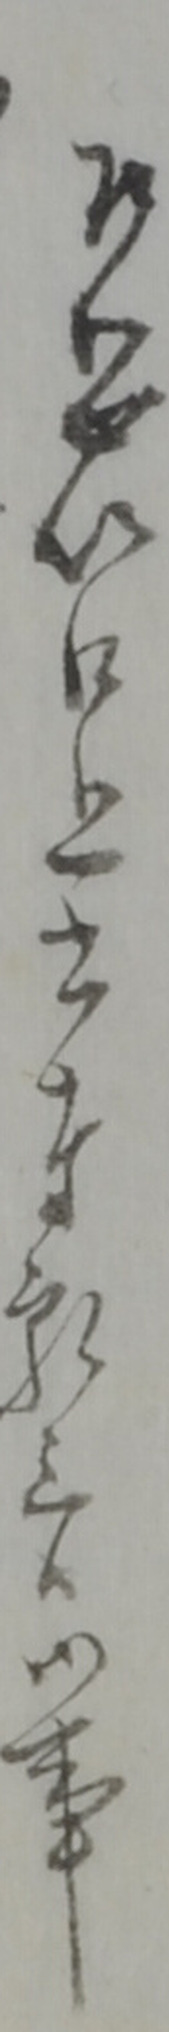乍恐以口上書奉願上候御事
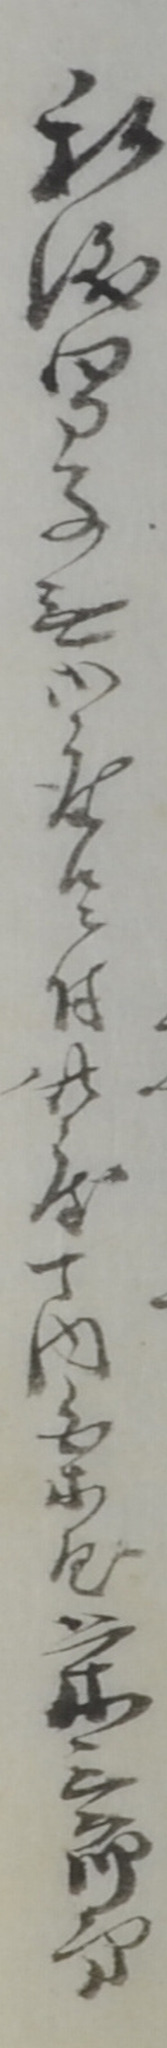私儀男子無御座候ニ付此度町内白木屋栄三郎弟

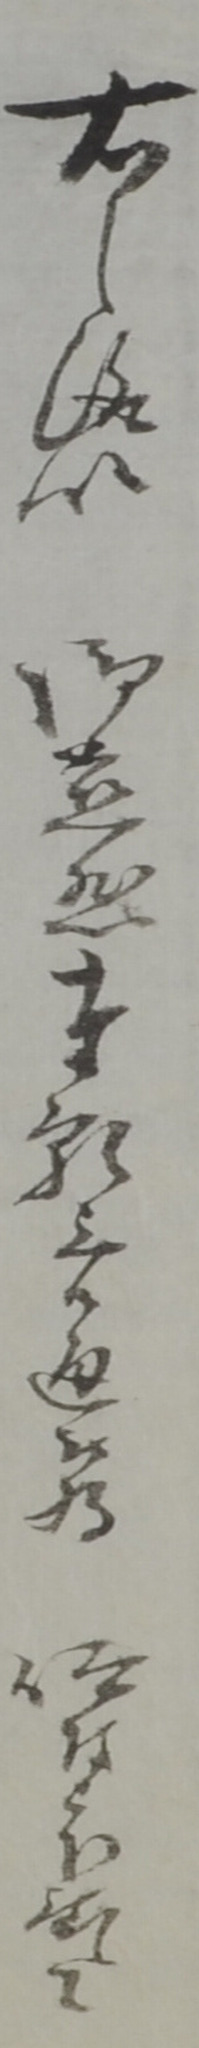右之趣以御慈悲奉願上候通被為仰付被下置候ハヽ
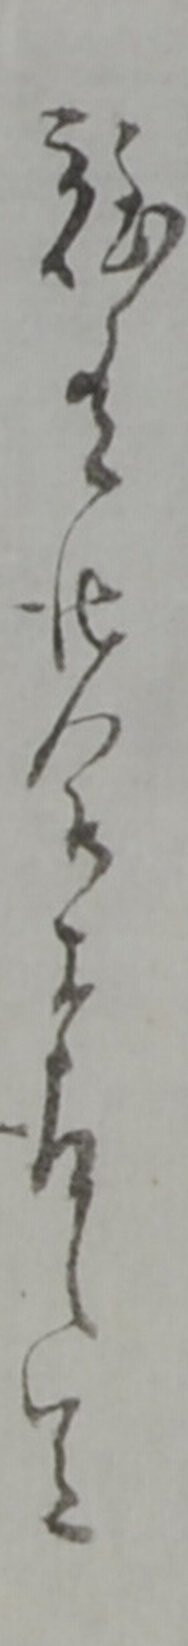難有仕合奉存候以上
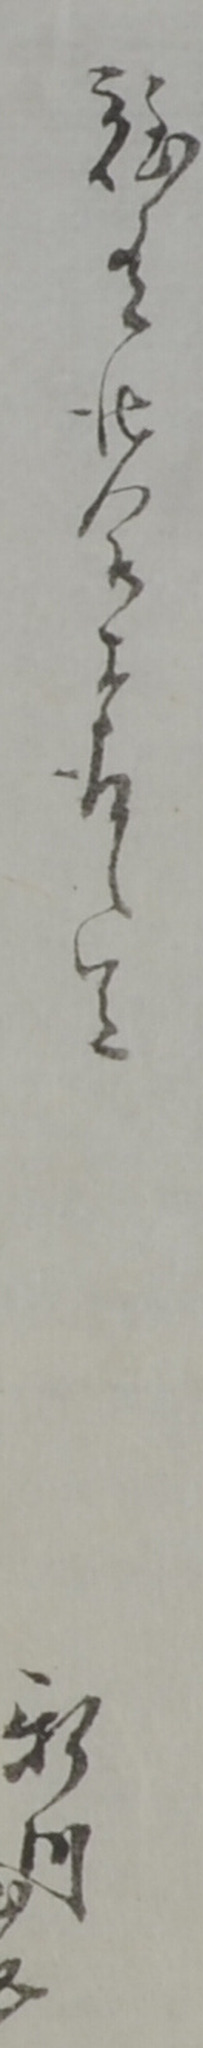難有仕合奉存候以上新町
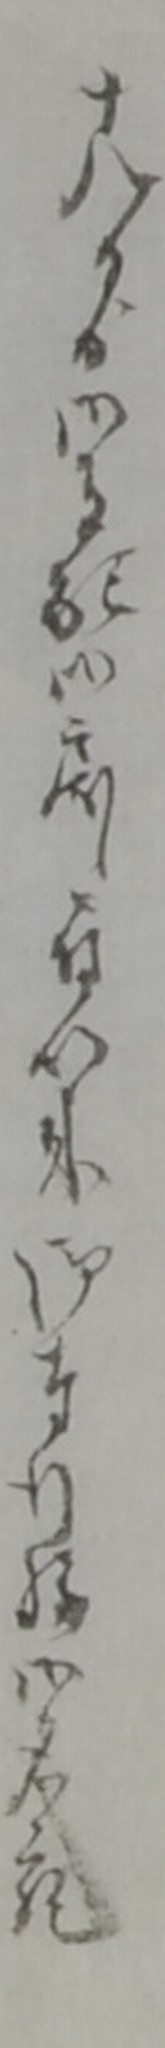十八日より御支配御戻しニ付以来御奉行様御名宛
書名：諸願書控帳
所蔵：伊那市立高遠町図書館・合同会社AMANE
